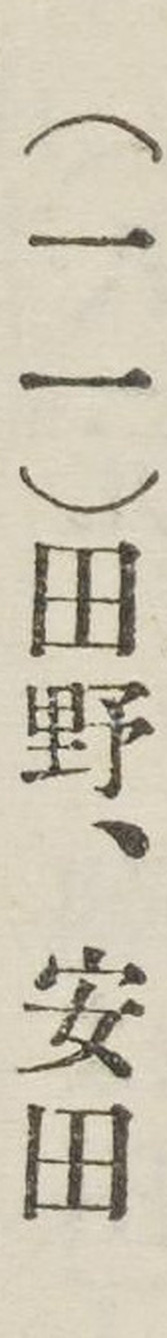田野、安田
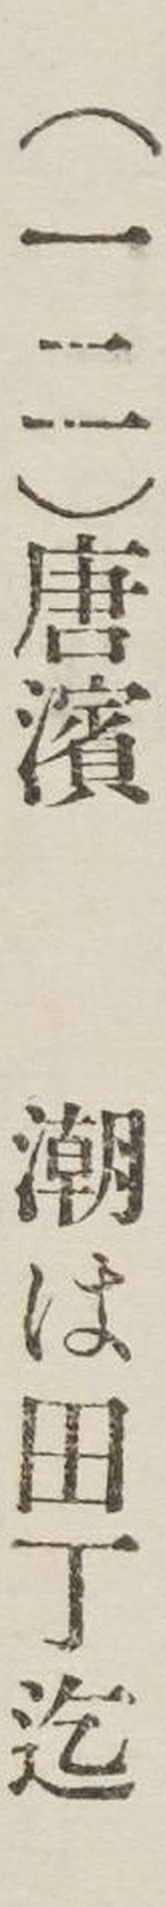唐濱潮は田丁迄
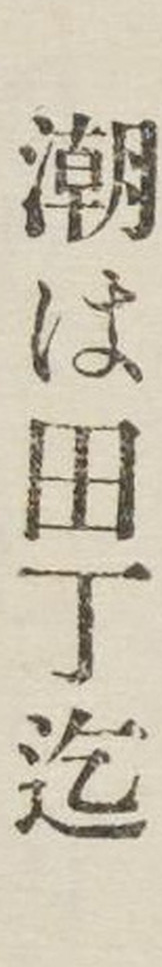唐濱潮は田丁迄
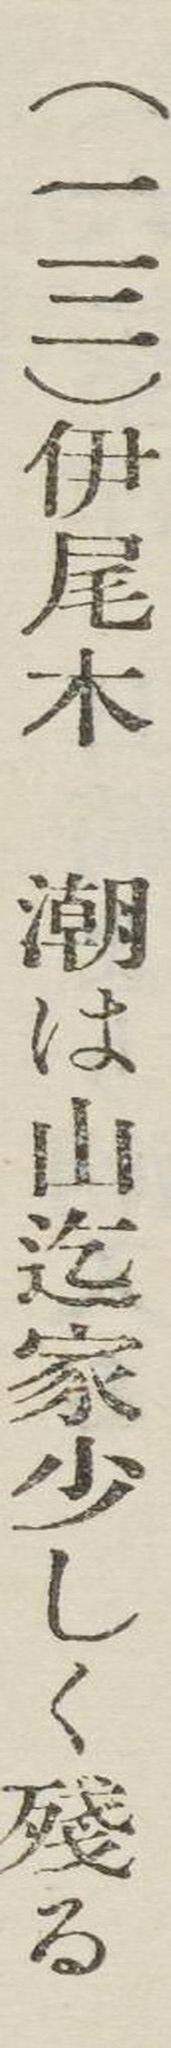伊尾木潮は山迄家少しく残る
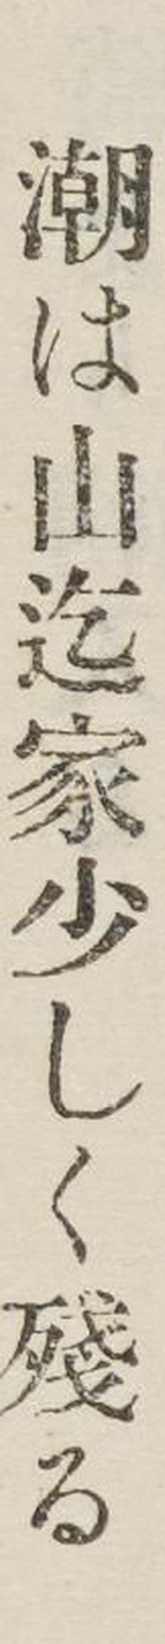伊尾木潮は山迄家少しく残る
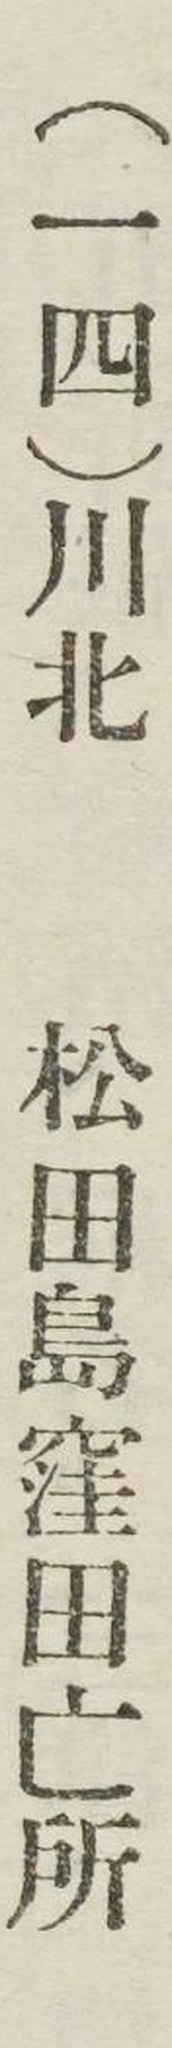川北松田島窪田亡所
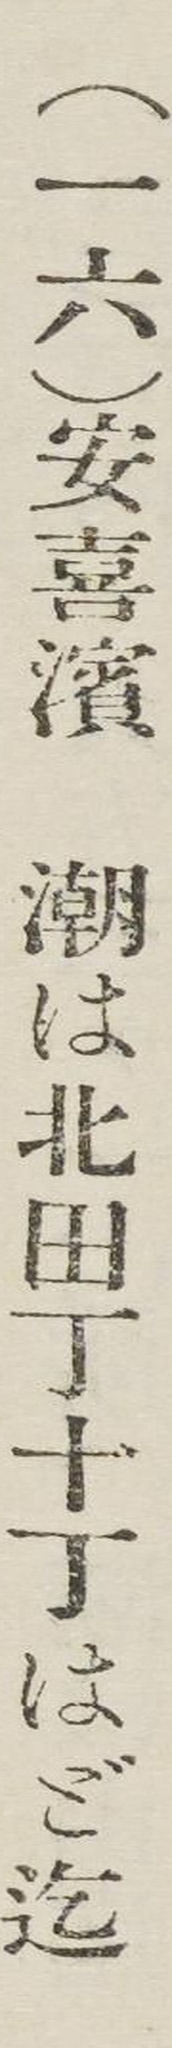安喜濱潮は北田丁十丁はど迄
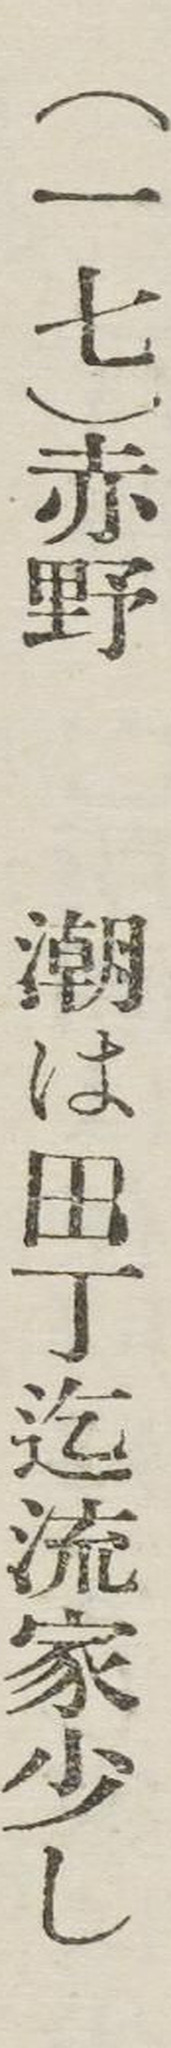赤野潮は田丁迄流家少し
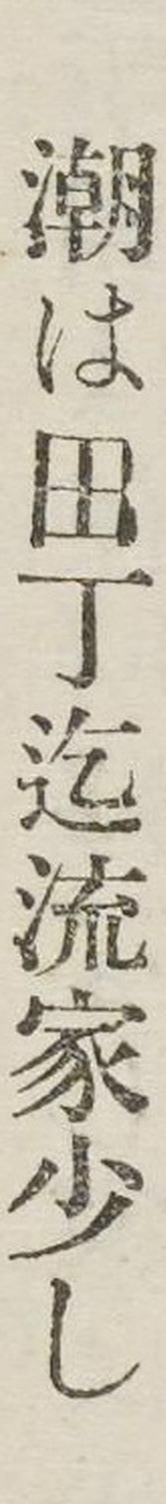赤野潮は田丁迄流家少し
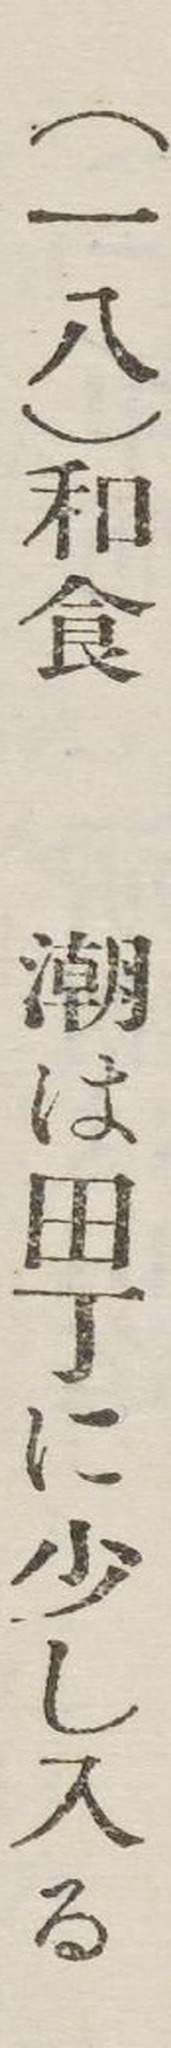和食潮は田丁に少し入る
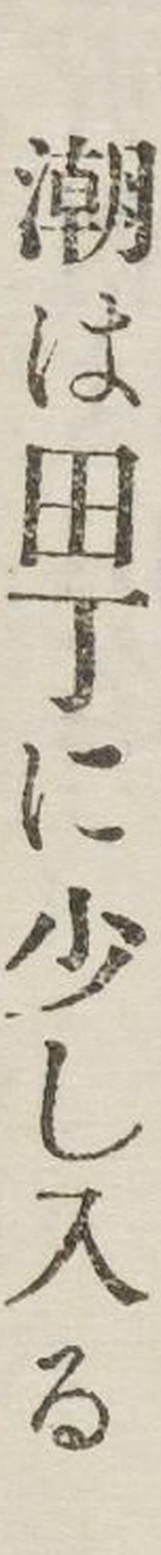和食潮は田丁に少し入る
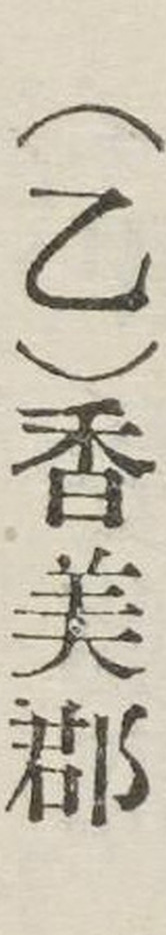香美郡
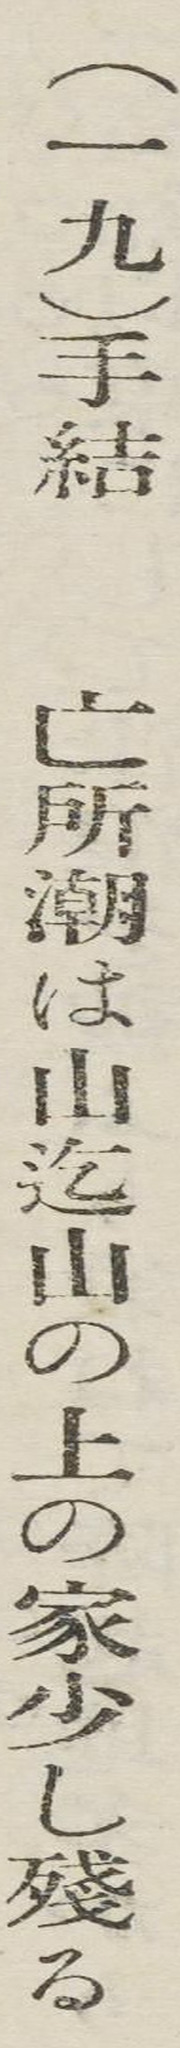手結亡所潮は山迄山の上の家少し残る
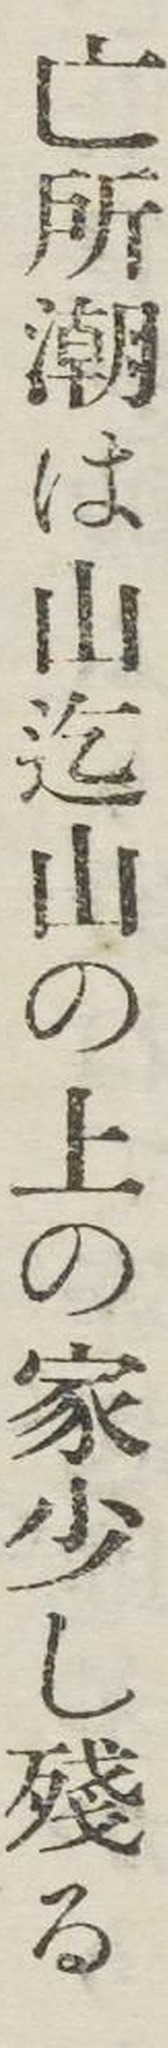手結亡所潮は山迄山の上の家少し残る
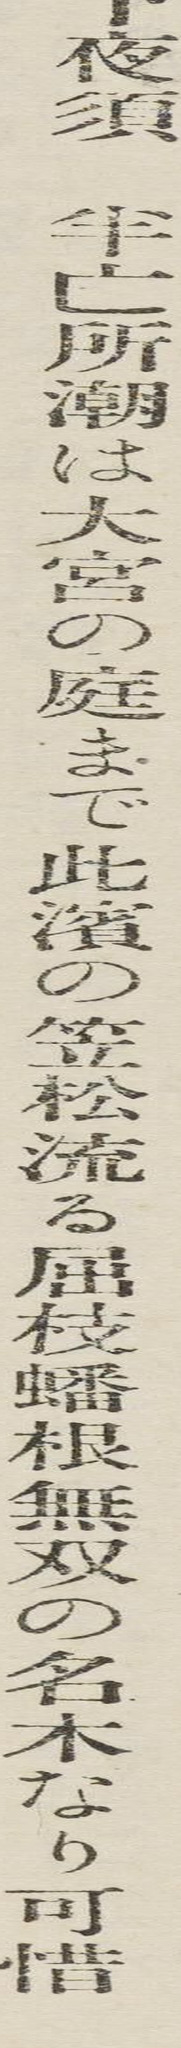下夜須半亡所潮は大宮の庭まで此濱の笠松流る屈枝蟠根無双の名木なり可惜
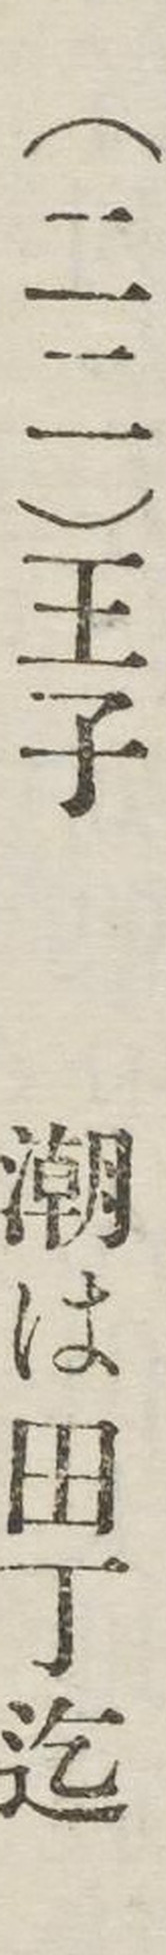王子潮は田丁迄
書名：土佐古今ノ地震
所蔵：東京大学地震研究所図書室 Earthquake Research Institute Library, The University of Tokyo, JAPAN
